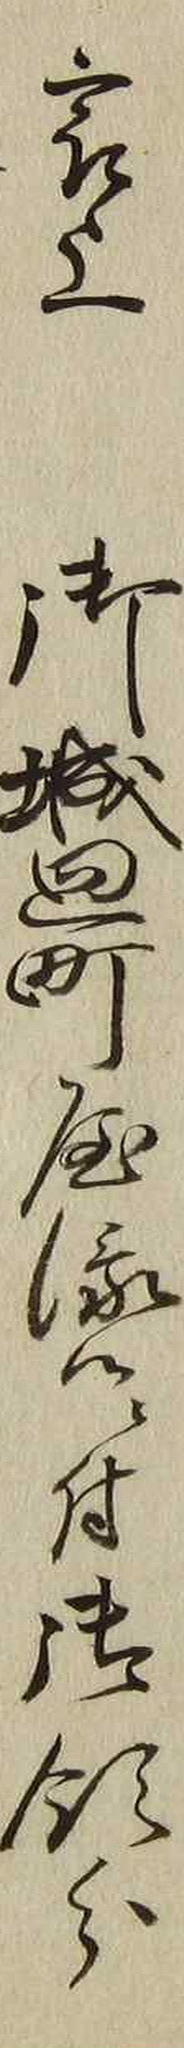最上御城廻町屋流候ニ付御領分
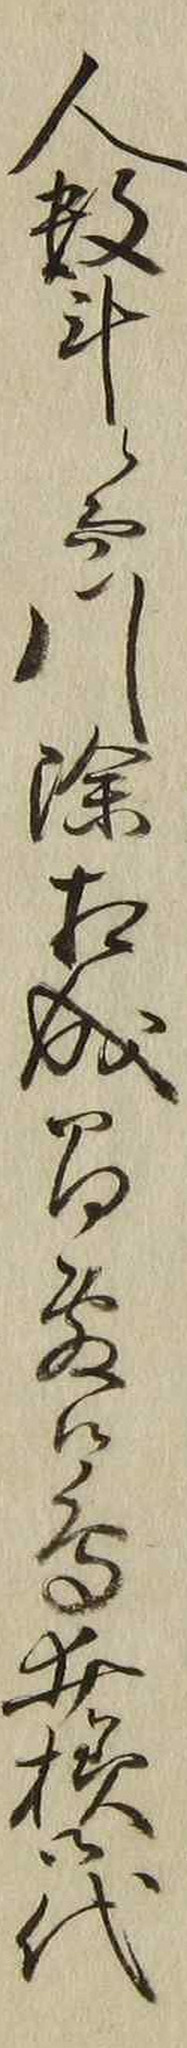人数計ニ而川除相成間敷候鳥井様御代
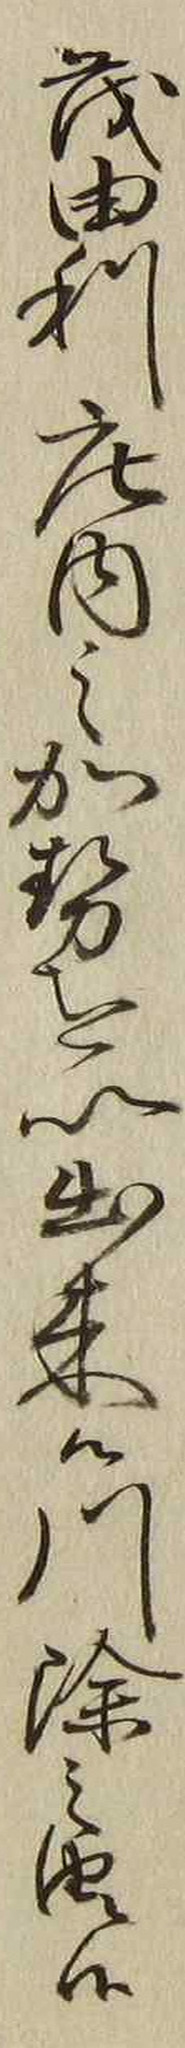茂由利庄内之加勢を以出来候川除之由ニ候
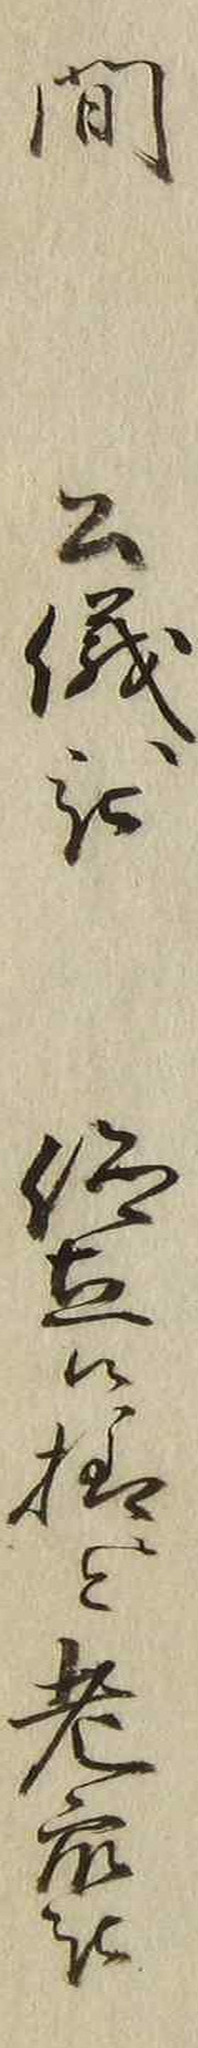間公儀へ被仰立候様ニと老衆被
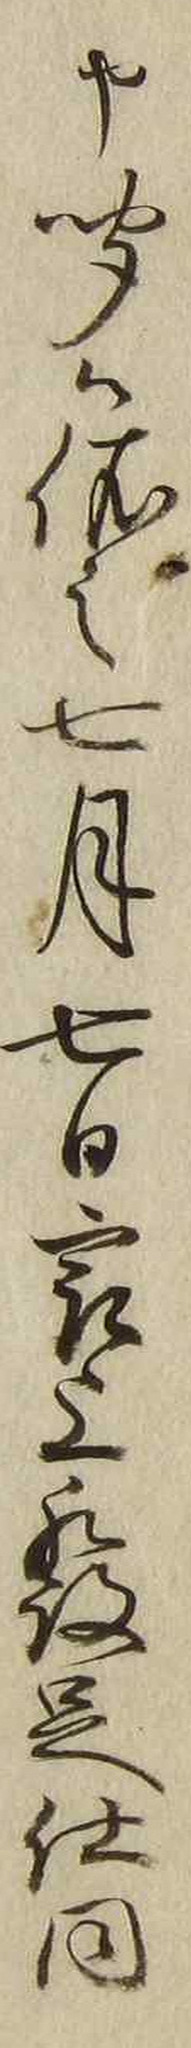申聞候依之七月七日最上発足仕同
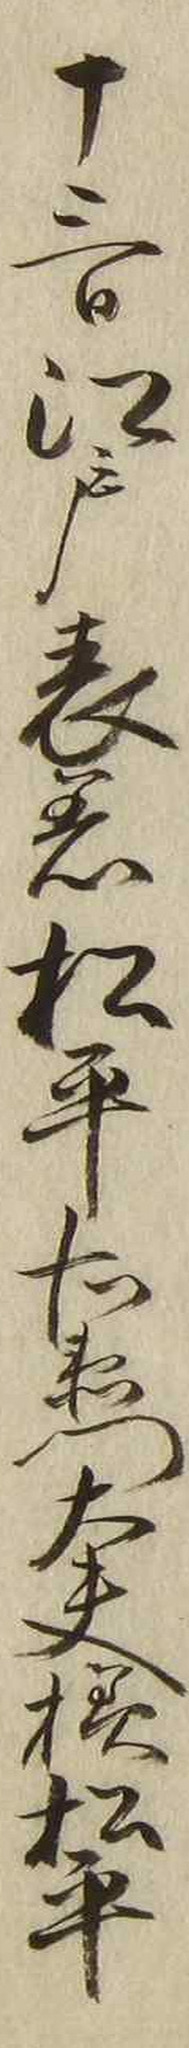十三日江戸表着松平右衛門大夫様松平

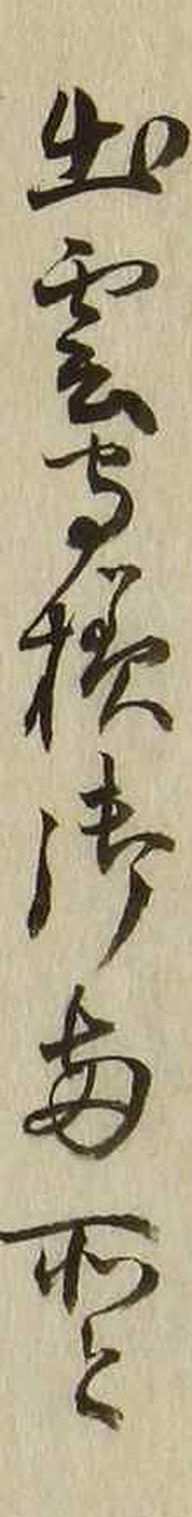出雲守様御両所と
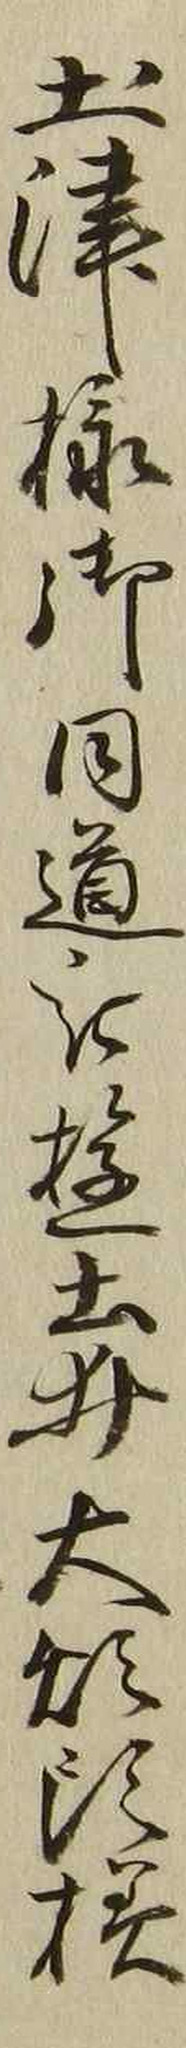土津様御同道被遊土井大炊頭様
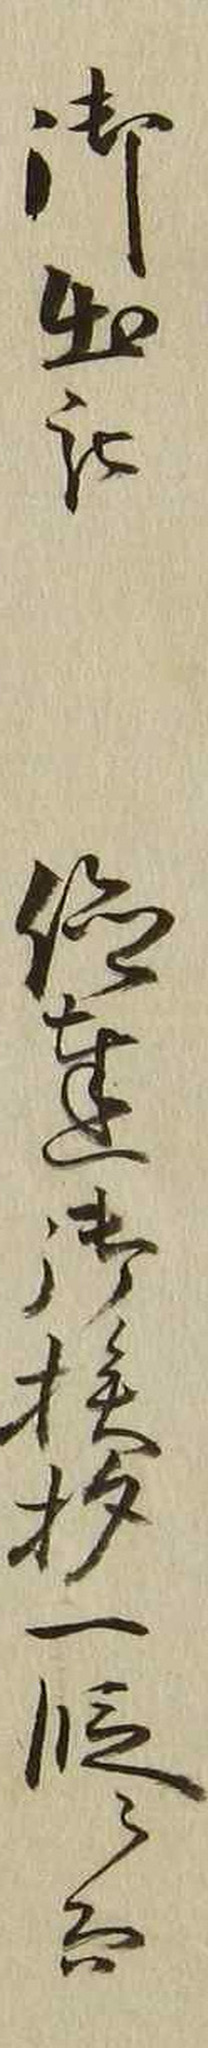御出被仰達御挨拶一段ニ而
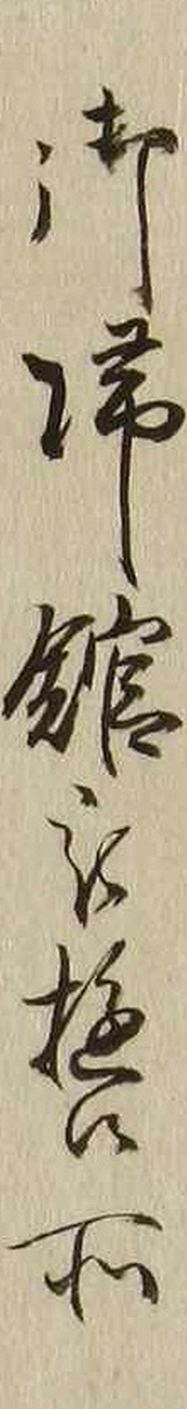御帰館被遊候所
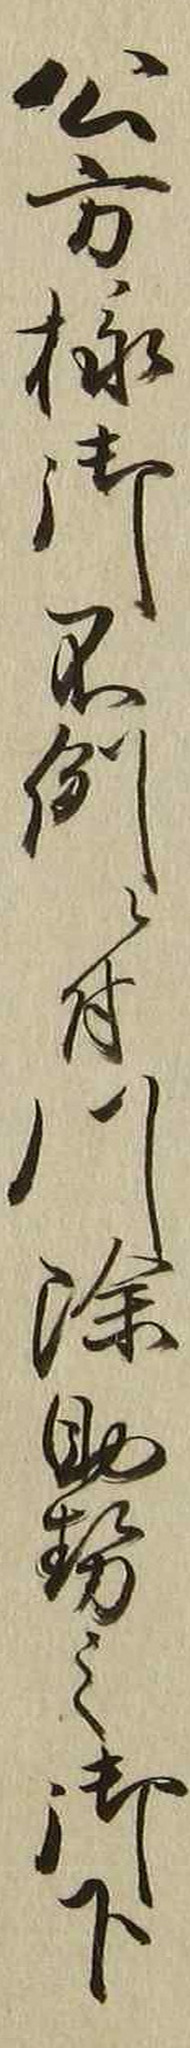公方様御不例ニ付川除助勢之御下
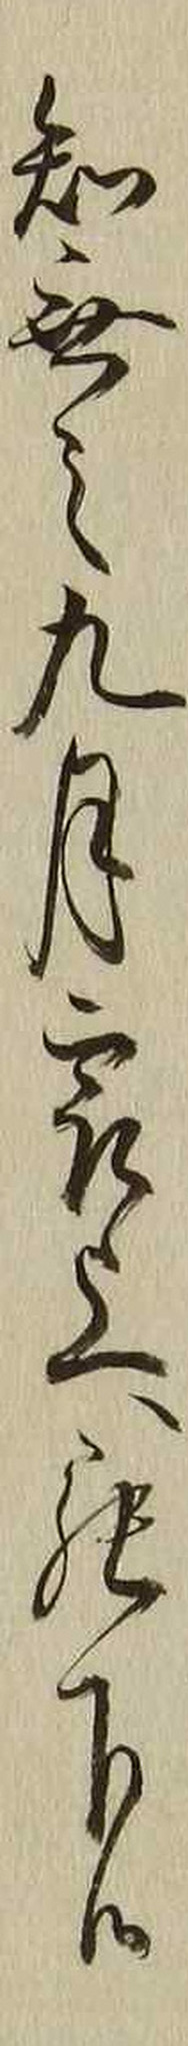知無之九月最上へ罷下候
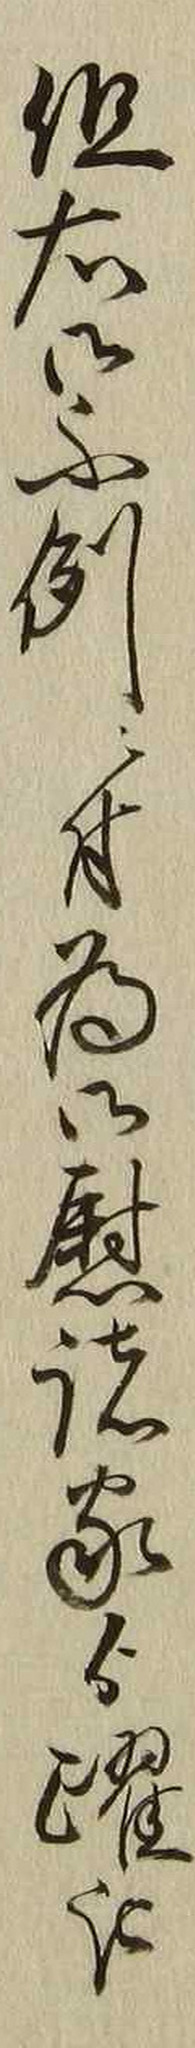但右御不例ニ付為御慰諸家ゟ躍被
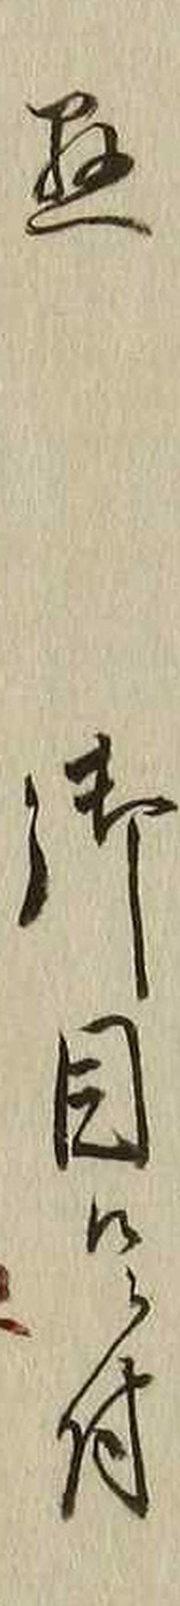懸御目候ニ付
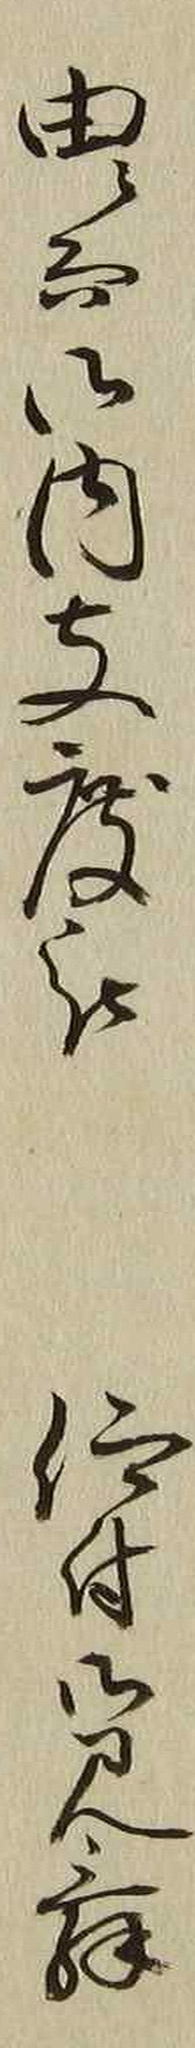由ニ而御内支度被仰付御見舞
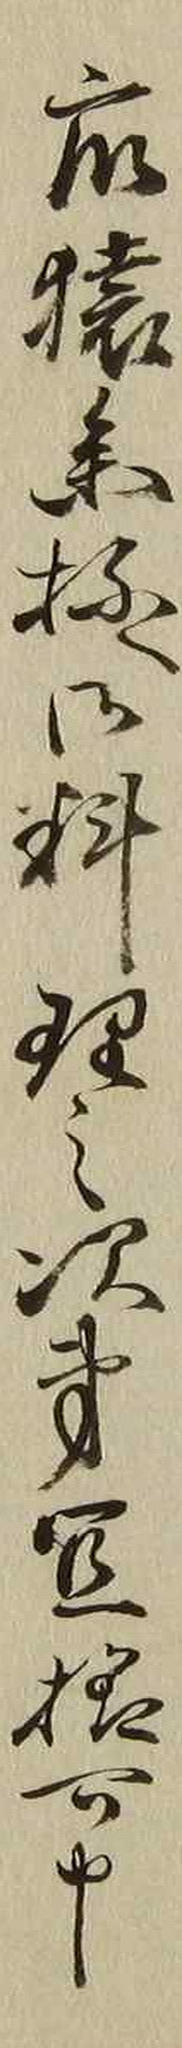衆猿参抔へ御料理之次第宜様可申
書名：諸士系譜　巻之60　と之部3
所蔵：会津若松市立会津図書館
